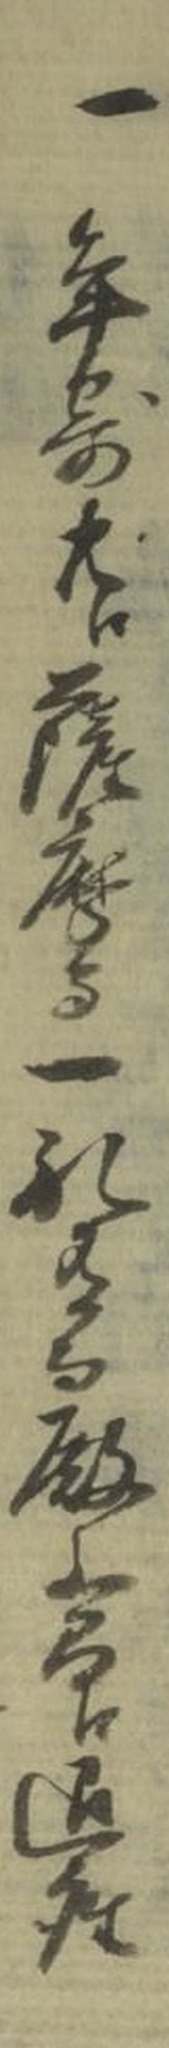一年寄共え薩摩守一礼有て殿上間え退座
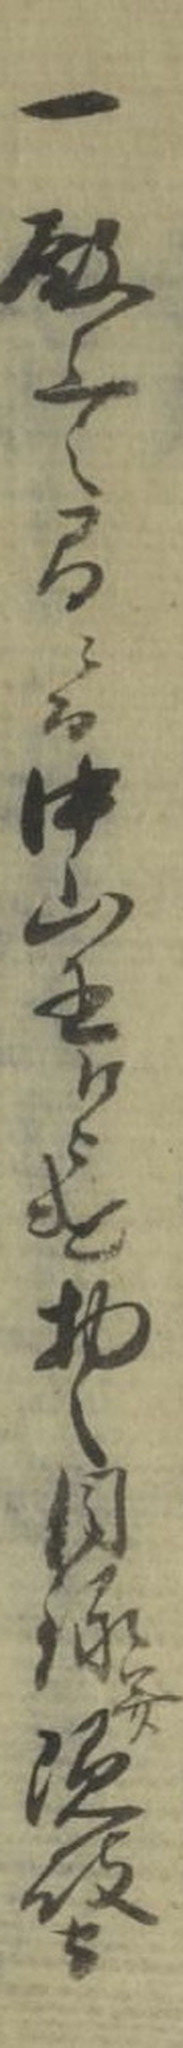一殿上之間にて中山王え被遣物之目録并隠岐守

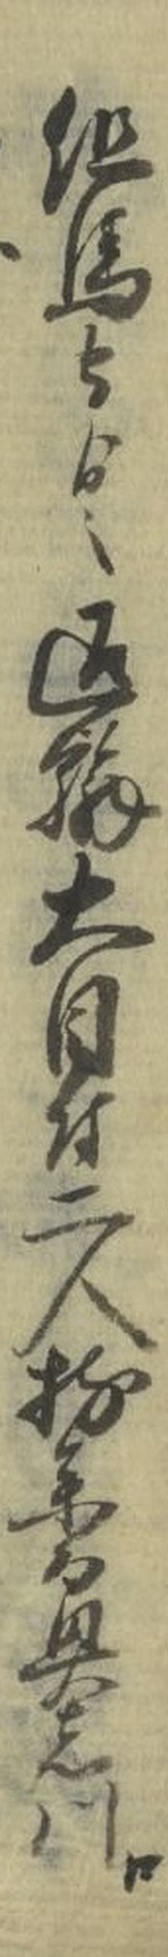但馬守ゟ之返翰大目付二人持参而具志川え
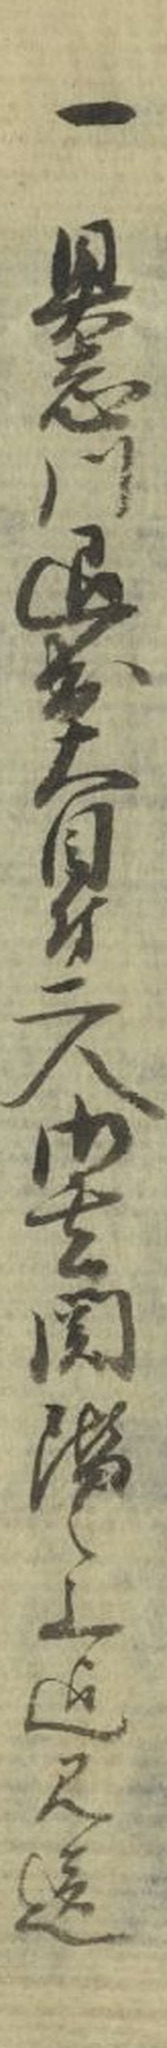一具志川退出大目付二人御玄関階之上迄見送
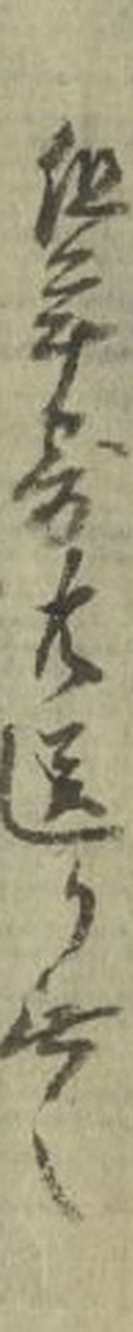但年寄共送り無之
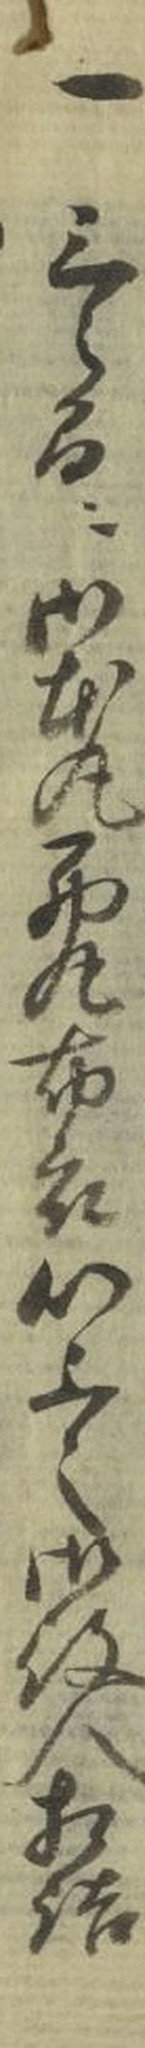一三之間に御本丸西丸布衣以上之御役人相詰
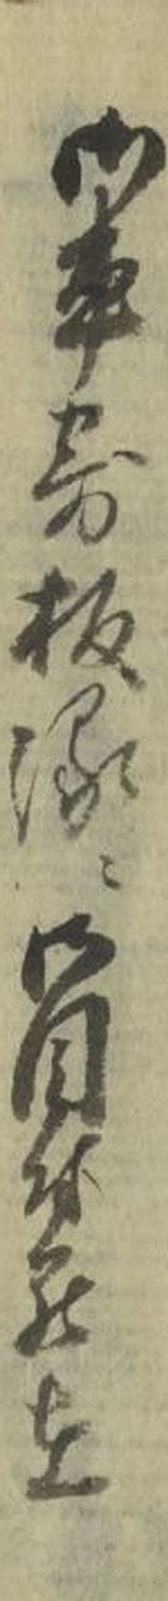御車寄板縁に御目付罷在
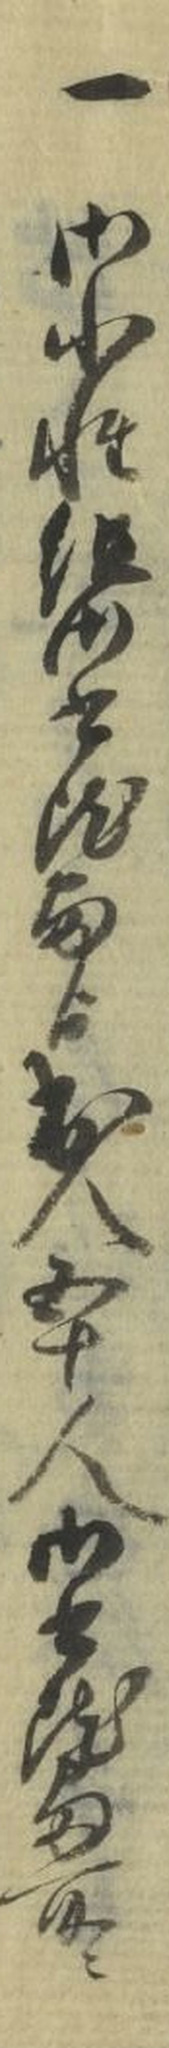一御小性組御書院番ゟ出人五十人御書院番所に
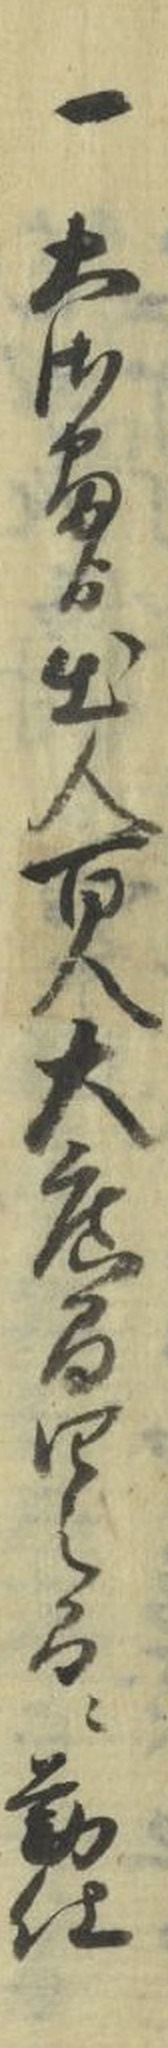一大御番ゟ出人百人大広間四之間に勤仕
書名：戊辰琉球人来朝之式 全
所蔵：University of the Ryukyus Library
